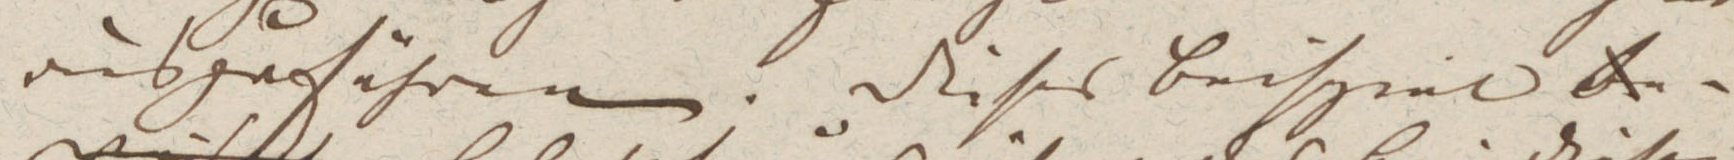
auszuführen. Dieses Beispiel be-
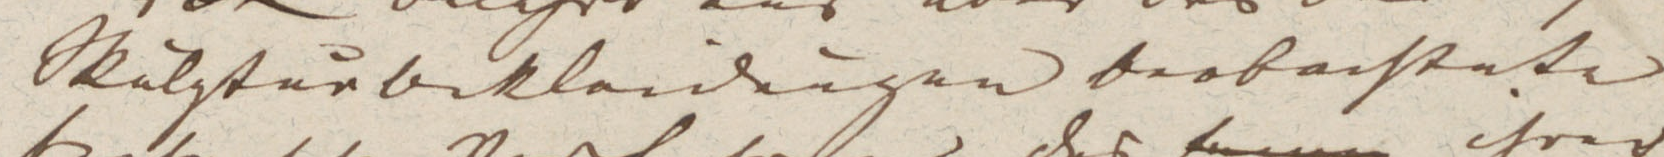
Skulpturbekleidungen beobachtete
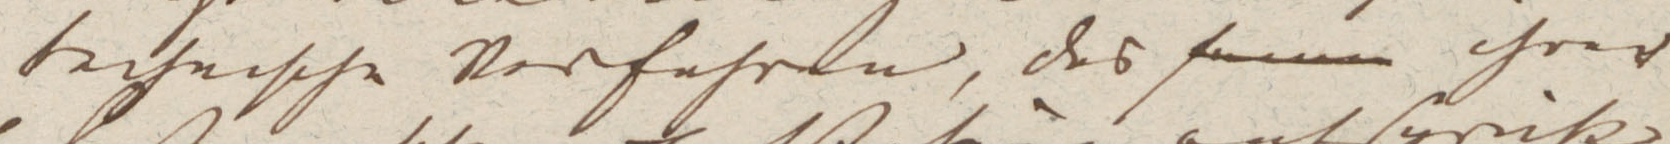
technische Verfahren, das seine ihre
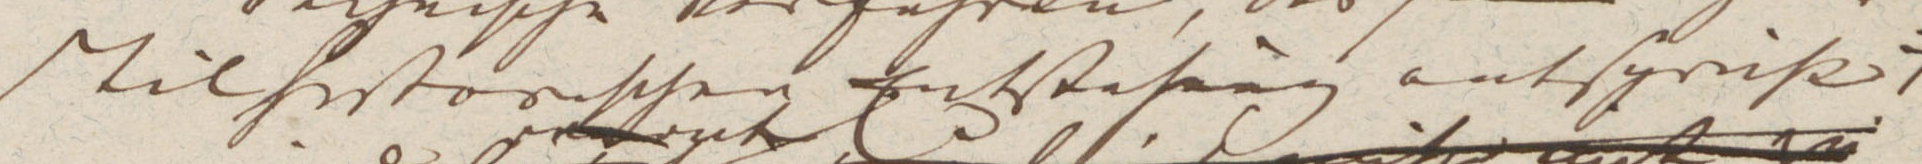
stilhistorischen Entstehung entspricht %
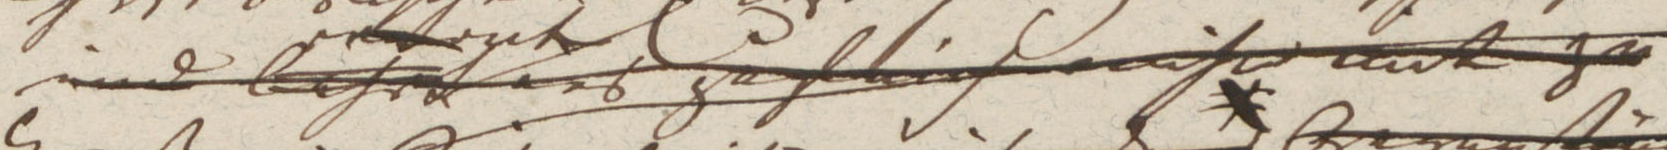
und lehrt zugleich nicht mit zu
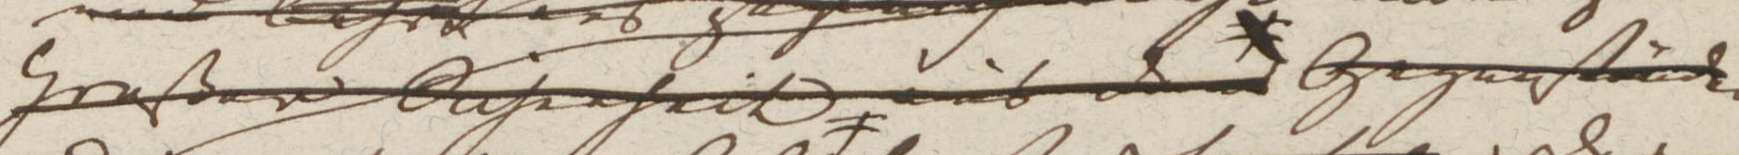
grosser Sicherheit aus dem % Gegenständen
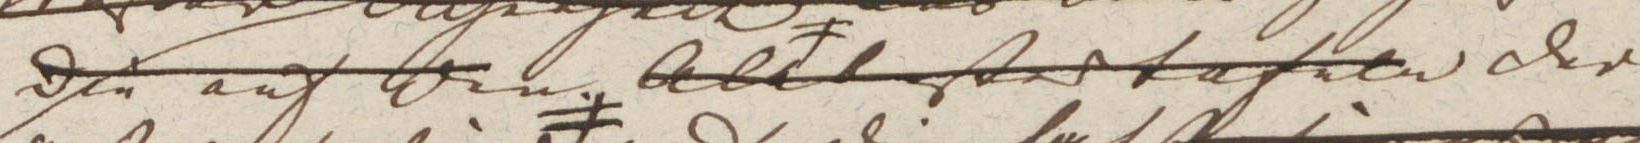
die auf den Alabastertafeln % dar-
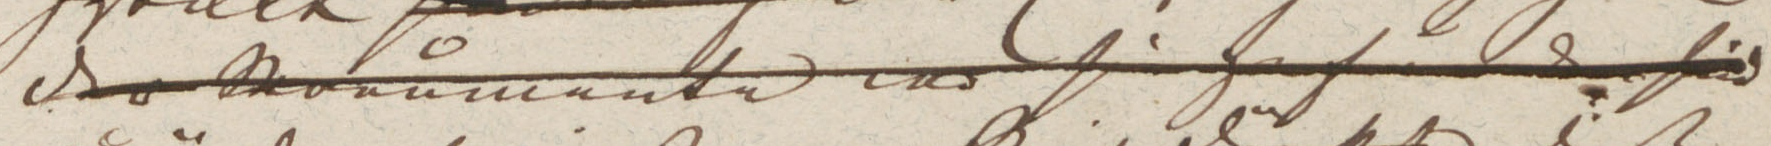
der Monumente sie gefunden sind
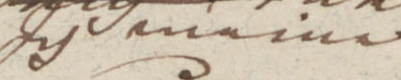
Ich meine
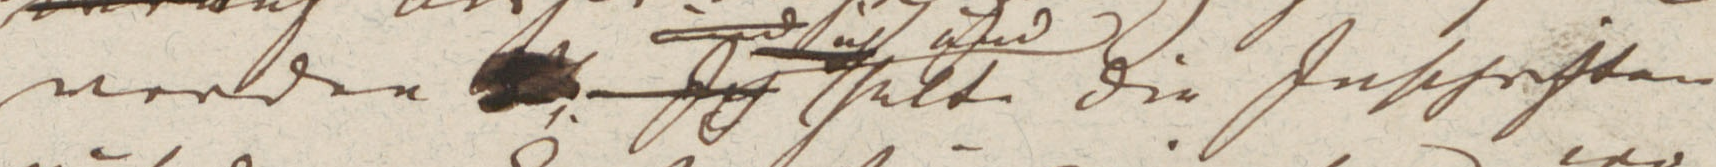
worden ist Ich und ich und halte die Inschriften
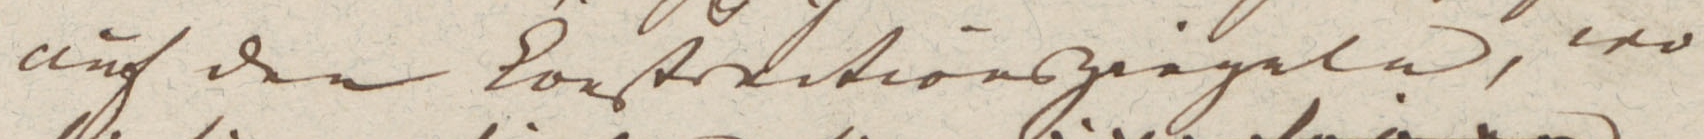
auf den konstructionsziegeln, wo
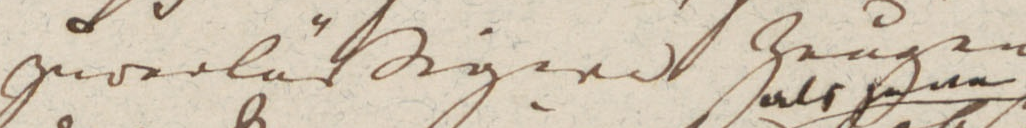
zuverlässigere Zeugen
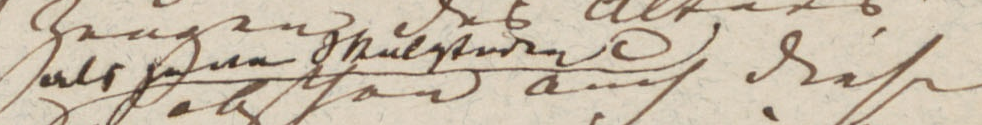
als jene Skulpturen, obschon auch diese
